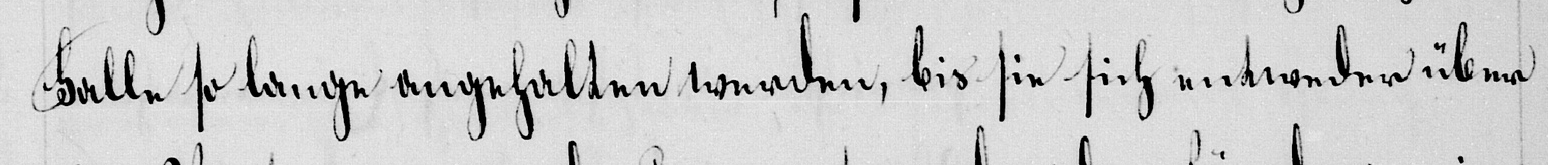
Falle so lange angehalten werden, bis sie sich entweder über
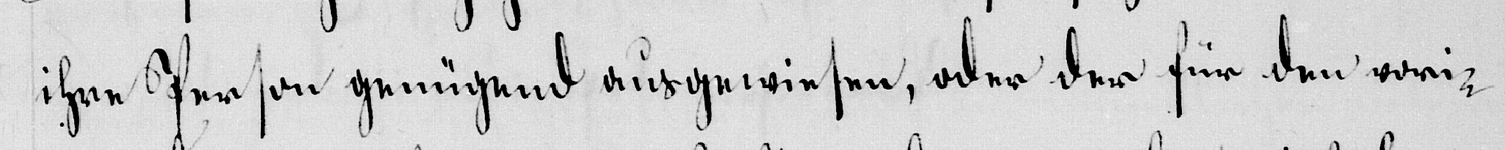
ihre Person genügend ausgewiesen, oder der für den vori¬
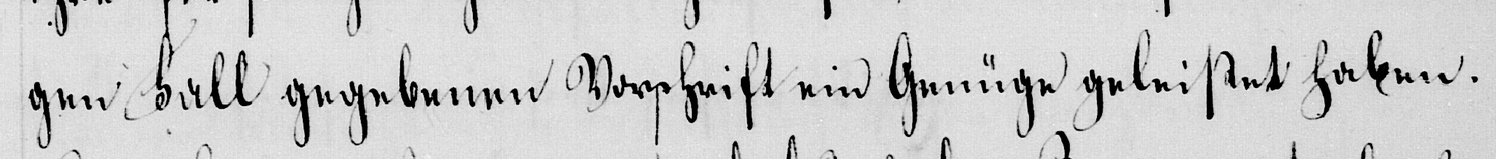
gen Fall gegebenen Vorschrift ein Genüge geleistet haben.
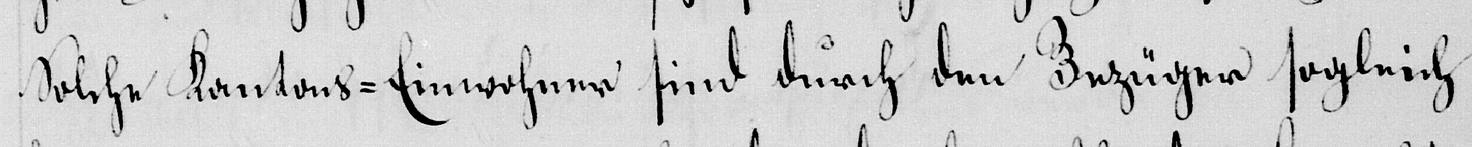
Solche Kantons-Einwohner sind durch den Bezüger sogleich
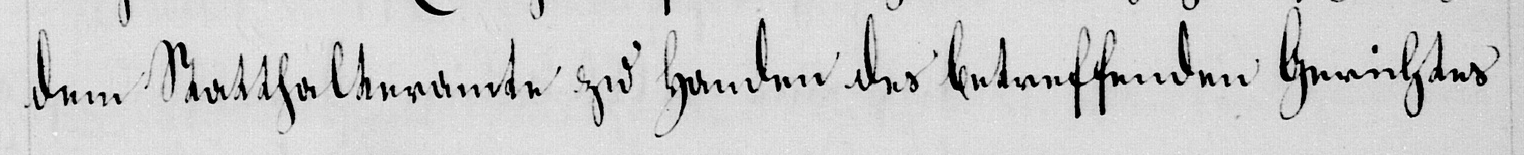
dem Statthalteramte zu Handen des betreffenden Gerichtes
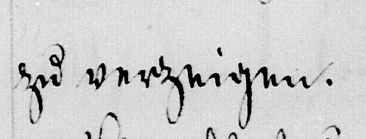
zu verzeigen.
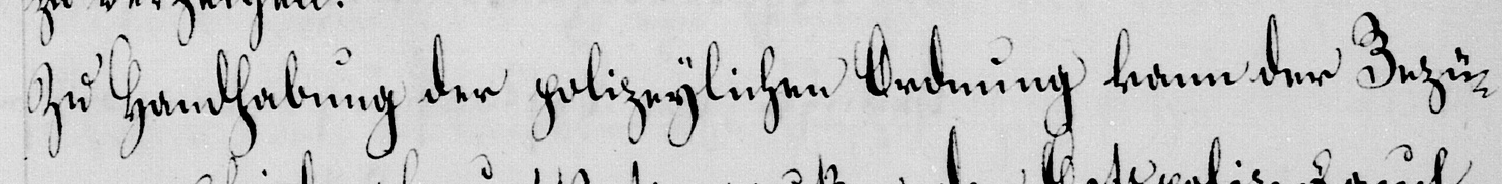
Zu Handhabung der polizeylichen Ordnung kann der Bezü¬
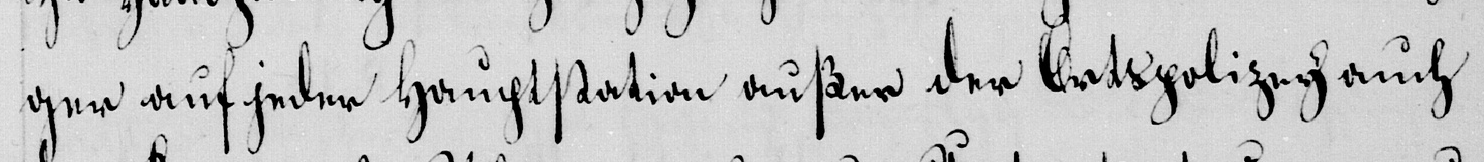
ger auf jeder Hauptstation außer der Ortspolizey auch
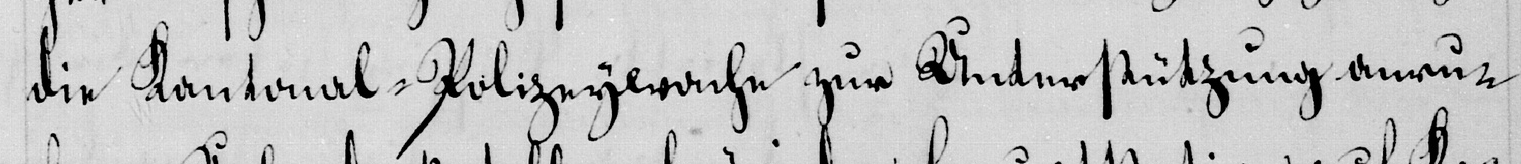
die Kantonal-Polizeywache zur Unterstützung anru¬
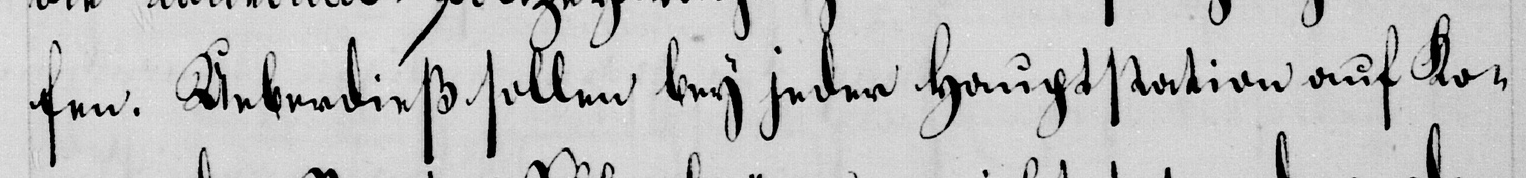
fen. Ueberdieß sollen bey jeder Hauptstation auf Ko¬
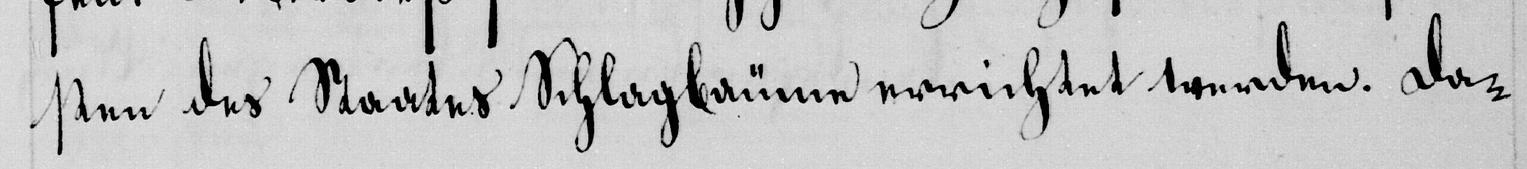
sten des Staates Schlagbäume errichtet werden. Da-
